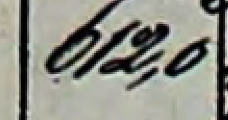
612,0
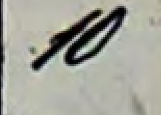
10
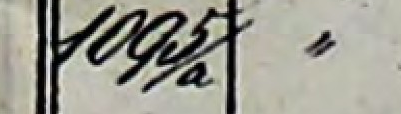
1095/a „
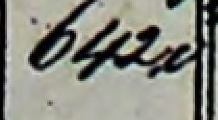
642,0
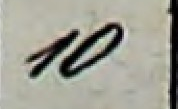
10
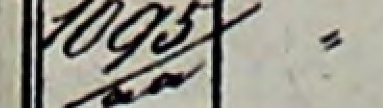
1095/aa „
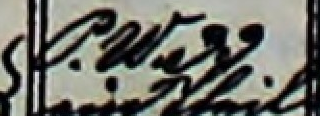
P.W. 33.
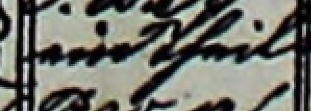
und Theil
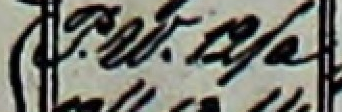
P.W. 12/a
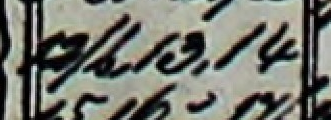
12/b. 13, 14
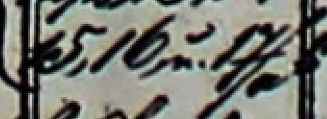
15, 16, u. 17/a
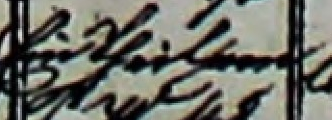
Ein Theilten
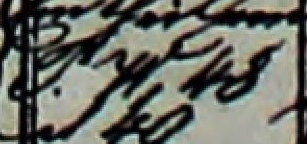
P.W. 48
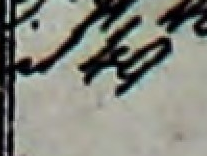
i? 49
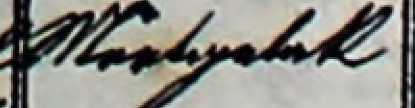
Martgelak
